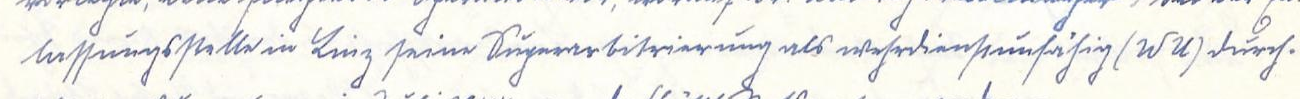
lassungsstelle in Linz seine Superarbitrierung als wehrdienstunfähig (WU) durch-
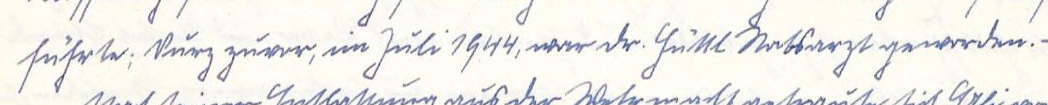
führte; Kurz zuvor, im Juli 19414, war Dr. Hüttl Stabsarzt geworden.
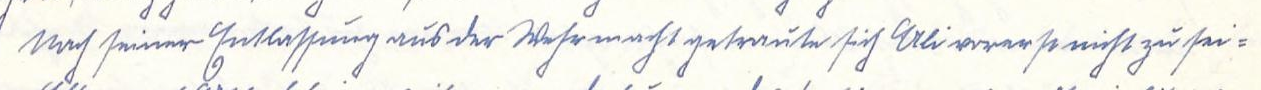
Nach seiner Entlassung aus der Wehrmacht getraute sich Ali vorerst nicht zu sei-
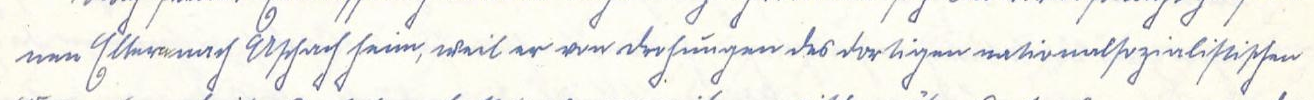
nen Eltern nach Aschach heim, weil er von Drohungen des dortigen nationalsozialistischen
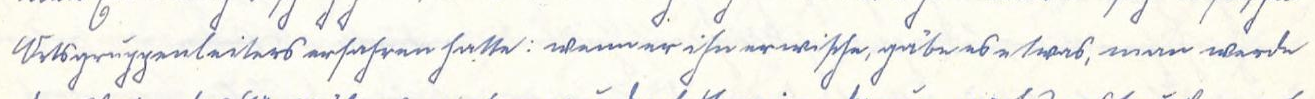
Ortsgruppenleiters erfahren hatte: wenn er ihn erwische, gäbe es etwas, man werde
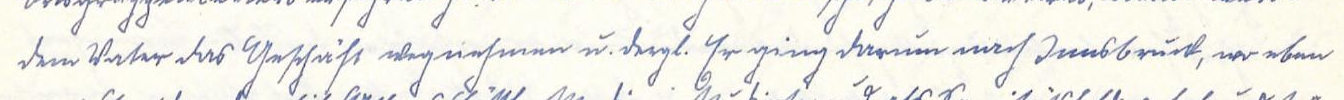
dem Vater das Geschäft wegnehmen u. degl. Er ging darum nach Innsbruck, wo eben
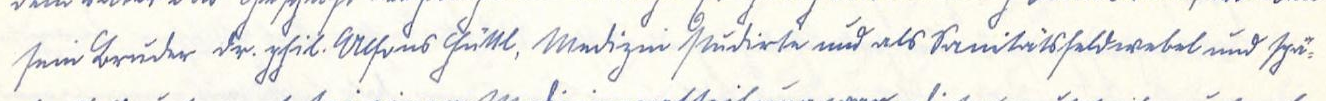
sein Bruder Dr. phil. Alfons Hüttl, Medizin studirte und als Sanitätsfeldwebel und spä-
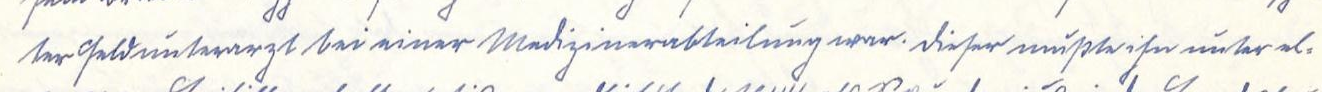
ter Feldunterarzt ber einer Medizinerabteilung war. Dieser mußte ihn unter el-
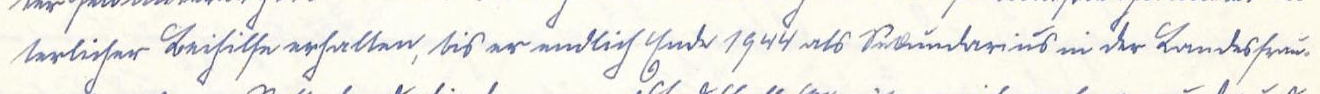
terlicher Beihilfe erhalten, bis er endlich Ende1944 als Sekundarius in der Landesfaru-
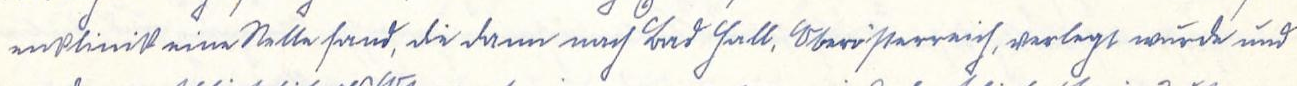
enklinik eine Stelle fand, die ihn dann nach Bad Hall, Oberösterreich, verlegt wurde und
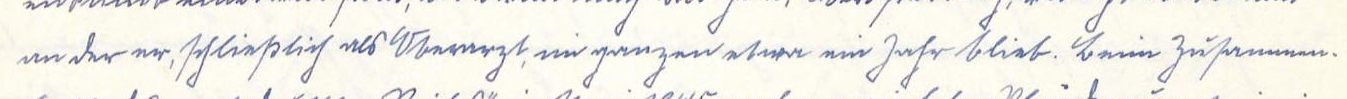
an der er schließlich als Obearzt, im ganzen etwa ein Jahr blieb. Bein Zusammen-
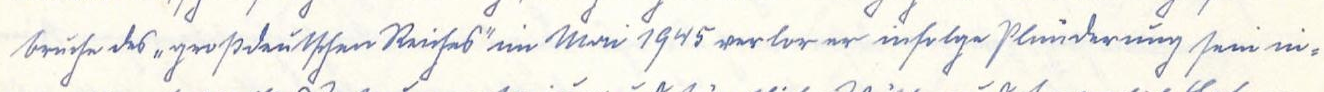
bruche des großdeutschen Reiches im Mai 1945 verlor er infolge Plünderung sein in-
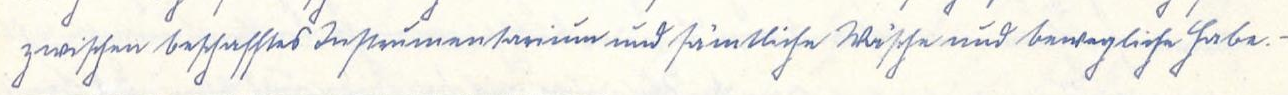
zwischen beschafftes Instrumentarium und sämtliche Wäsche und bewegliche Habe.
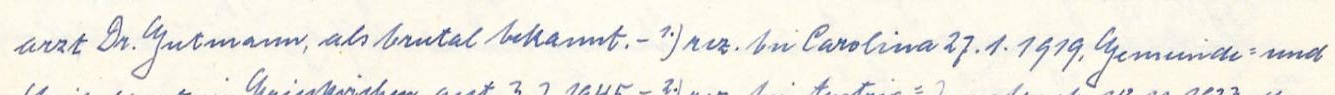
arzt Dr. Gutmann, als brutal bekannt. - 2) rez. bei Carolina 27. 1.1929, Gemeinde- und
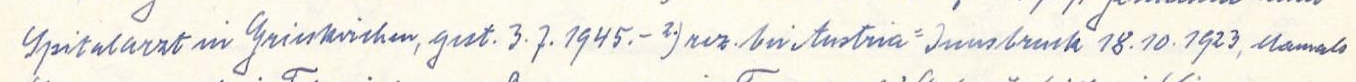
Spitalarzt in Grieskirchen, gest. 3.7.1945. - 2) rez. bei Austria- Innsbruck 18.10.1923, damals
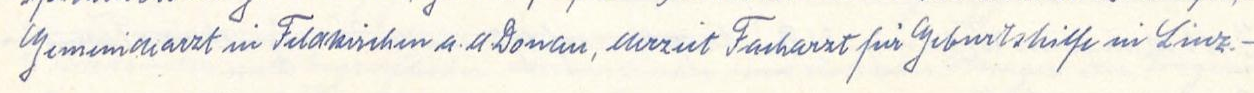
Gemeindearzt in Feldkichen a.d Donau, derzeit Facharzt für Geburtshilfe in Linz.
